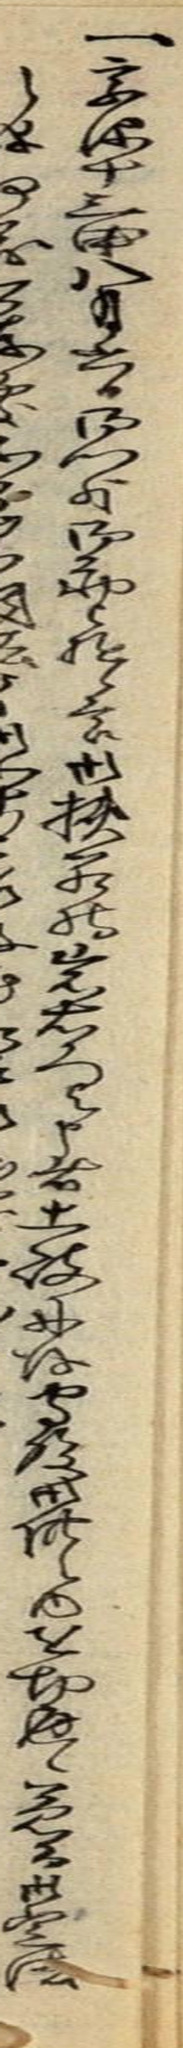一享保十三申八月六日御門外御勤被遊候節御挟箱持岩右衛門と申者土岐丹後守殿御供之内を切通候兼て御定法
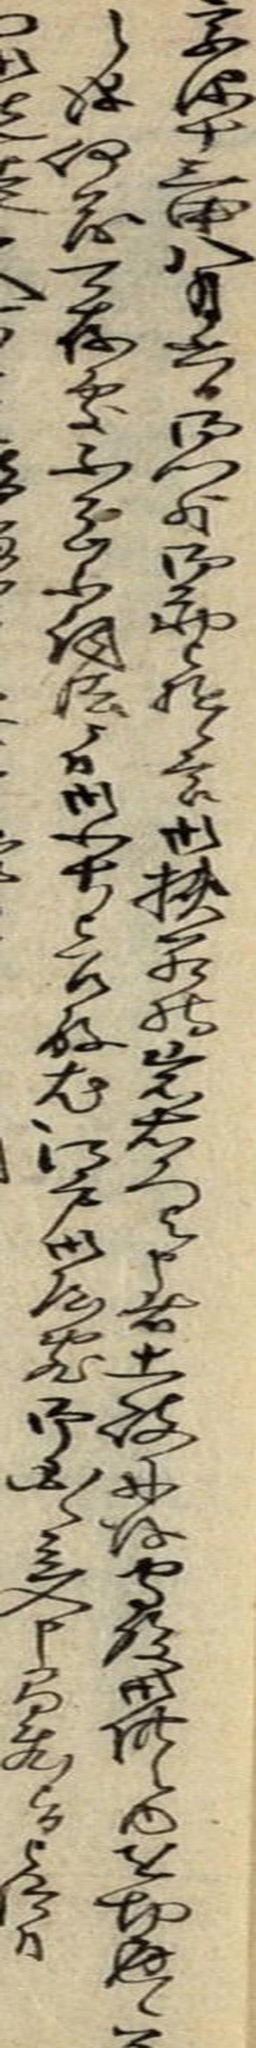之儀何も可存処不念不調法に付御ふち被召放尤江戸御屋敷御国へ立入申間敷旨被仰付
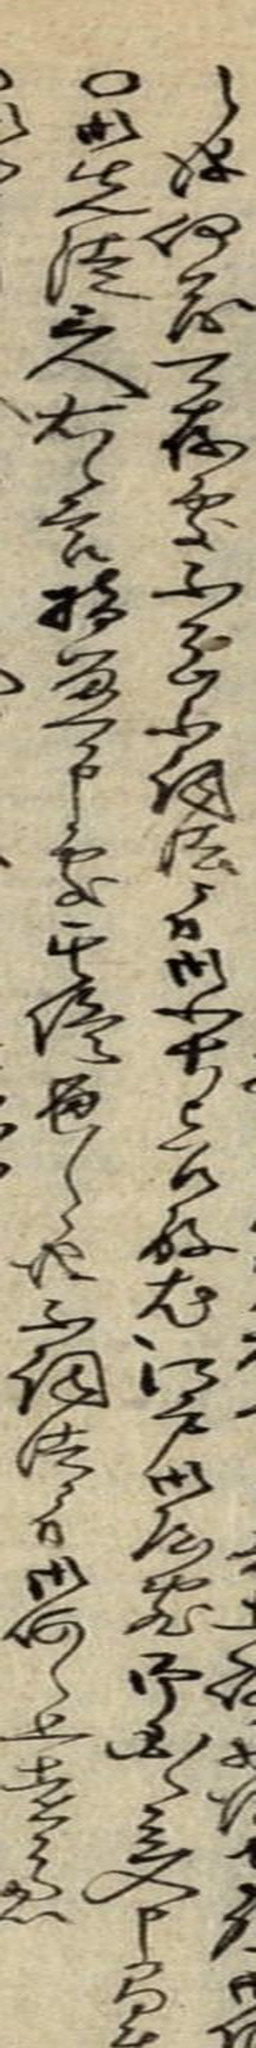○御先徒三人右之節指留可申処其儘通し候儀不調法に付御伺之上遠慮
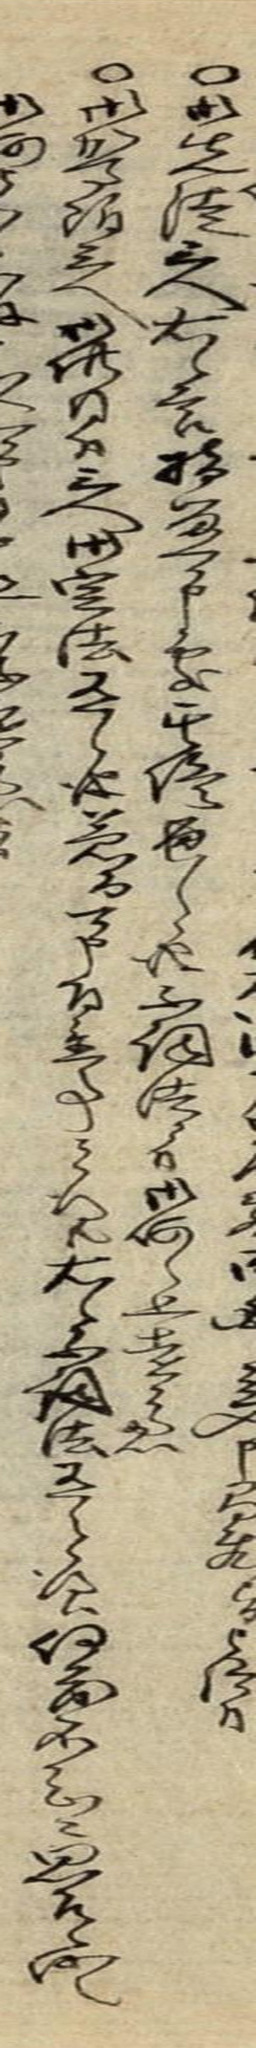○御駕附三人御供目付三人御定法有之儀兼て可申付置事に候得共右之不調法有之候得は何も不念に思召候仍之
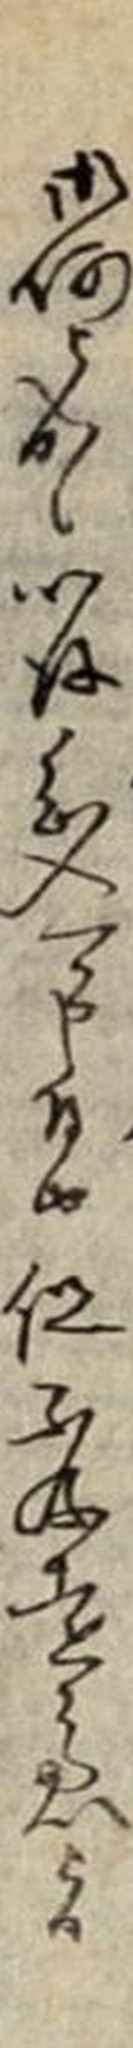御呵被成候以後念入可申付由但不及遠慮旨
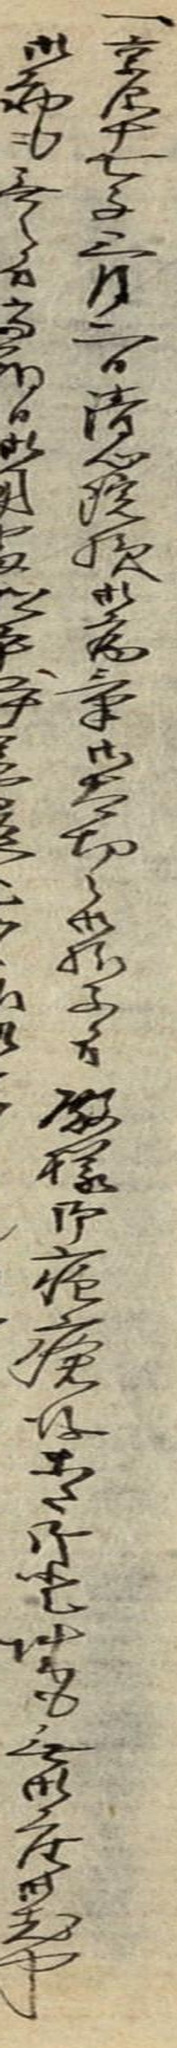一享保十七子三月二日清心院様御病気御太切之御様子に付殿様御疱瘡後末た御登城も無御座御老中
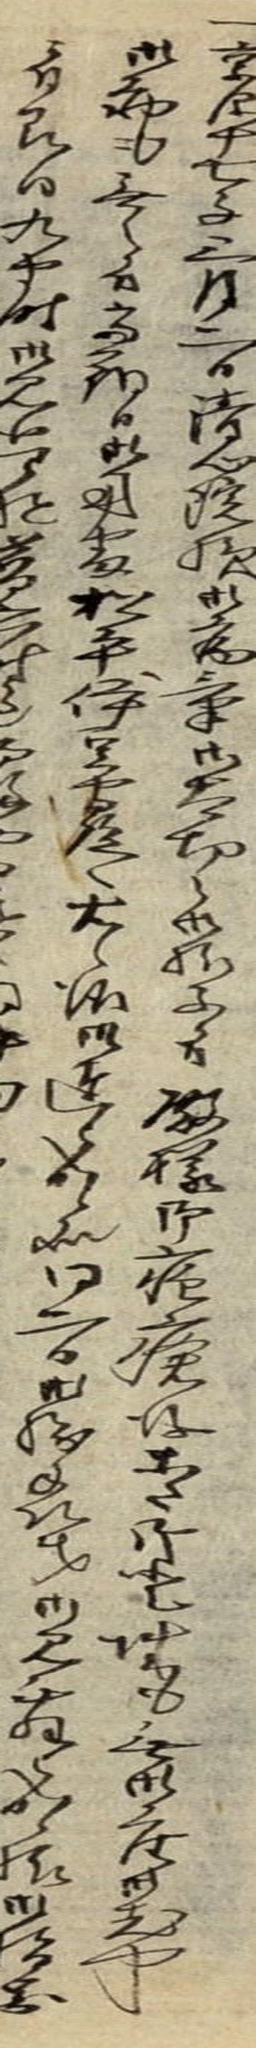御勤も無之候付当朔日御用番松平伊豆守殿へ右之趣御達被成候処同二日御勝手次第御見舞被成候様御指図
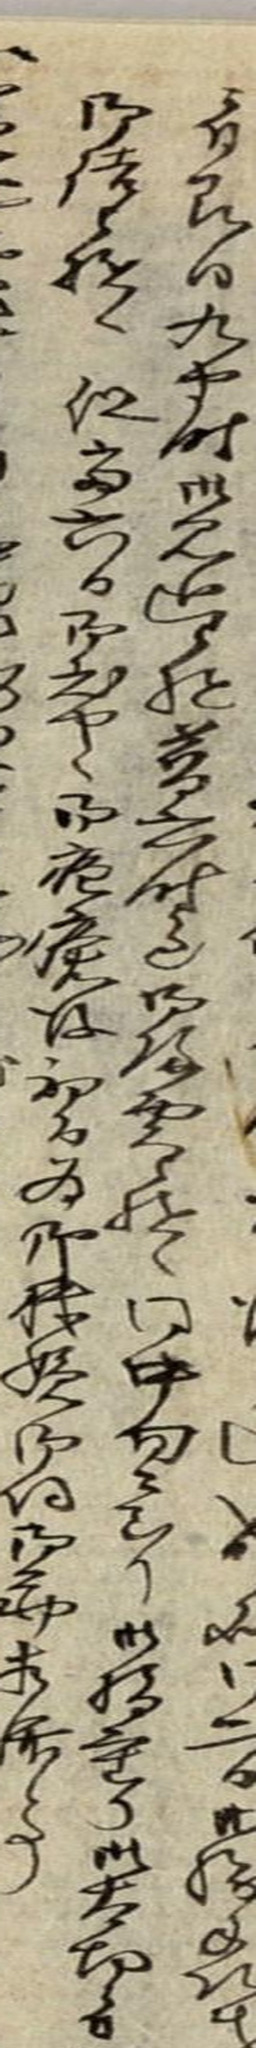御詰被遊候但当六日御老中へ御疱瘡後初て為御機嫌御伺御勤相済事
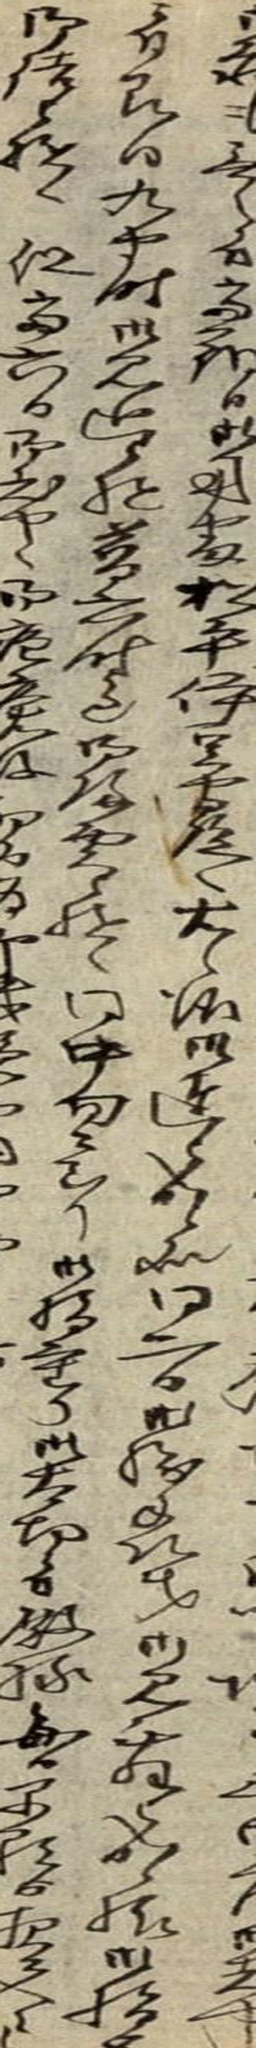に付即日九半時御見廻被遊暮六時過御帰殿被遊候同中旬に至り御指重り御太切に付殿様毎日早朝ゟ夜に入候迄
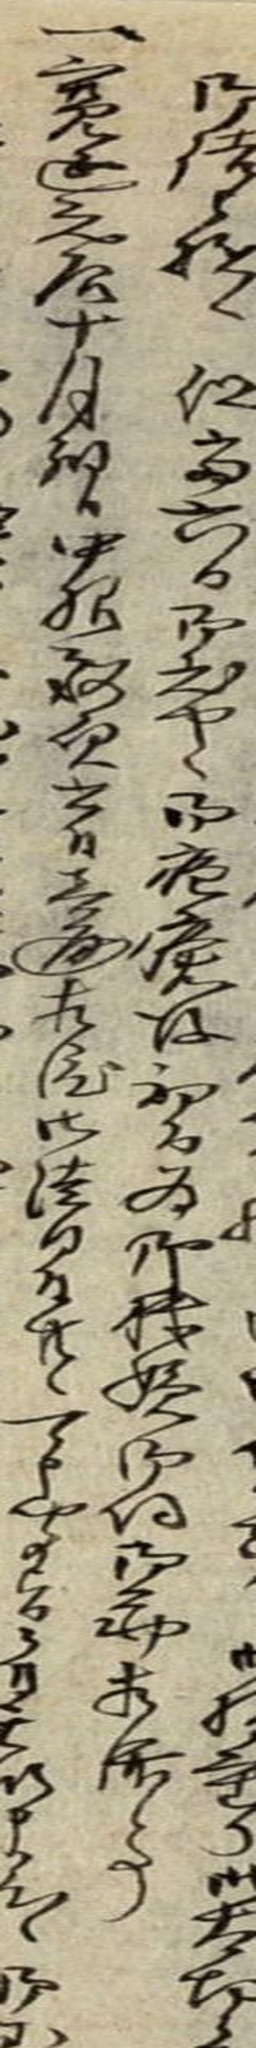一寛延元辰十月朔日中根靫負書付壱通相渡御徒目付共へ可申聞旨に付其段申渡候御国にて
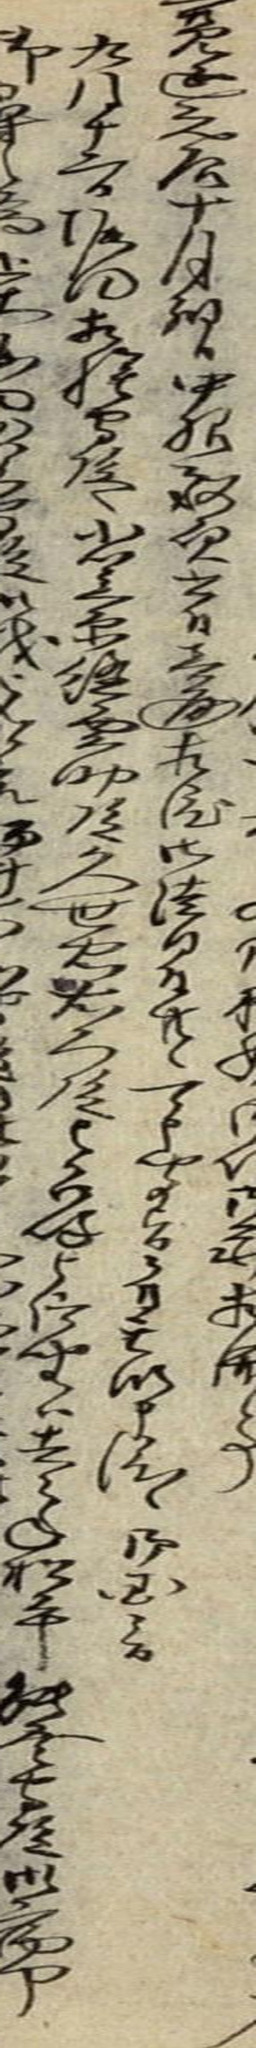九月十二日堀田相模守殿へ小笠原縫殿助殿久世忠右衛門殿被召呼被仰聞候は去々年松平能登守殿御病中
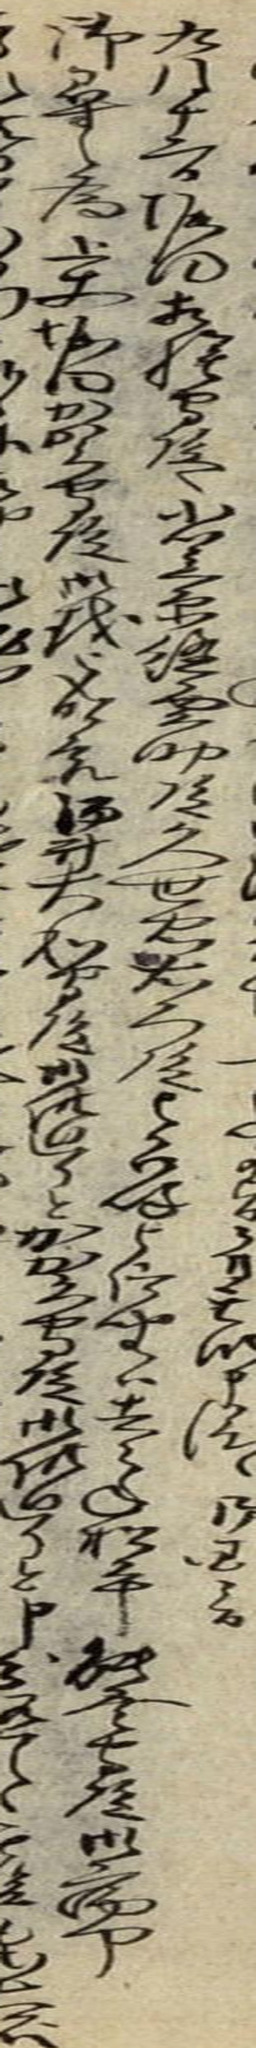御尋之為上使堀田加賀守殿御越被成候節酒井大和守殿御供廻りと加賀守殿御供廻りと申分有之候其後も御大名
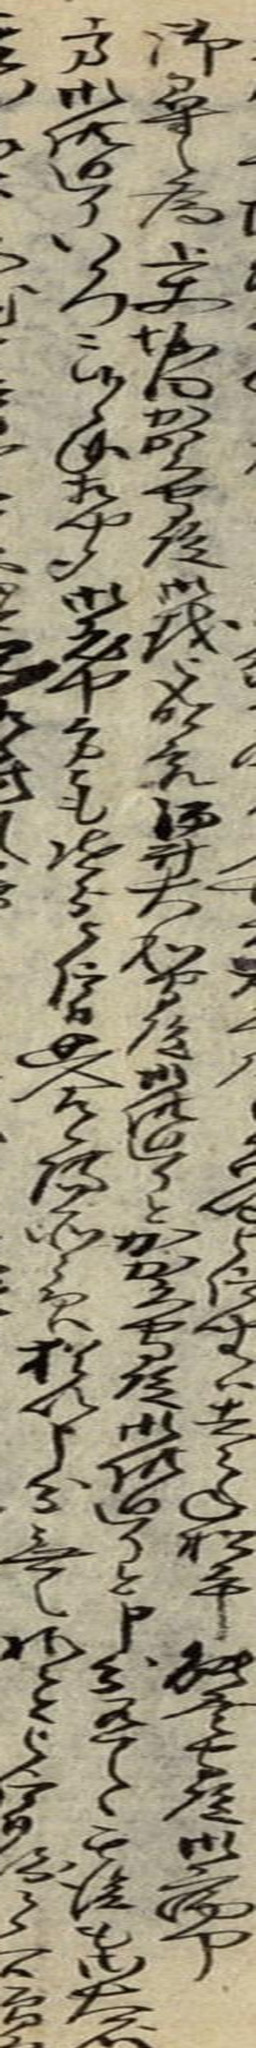方御供廻りいろ々候趣相聞御老中方とも随分被仰付込合候場所にては猶以申分無之様にと被仰付儀に候へは増て
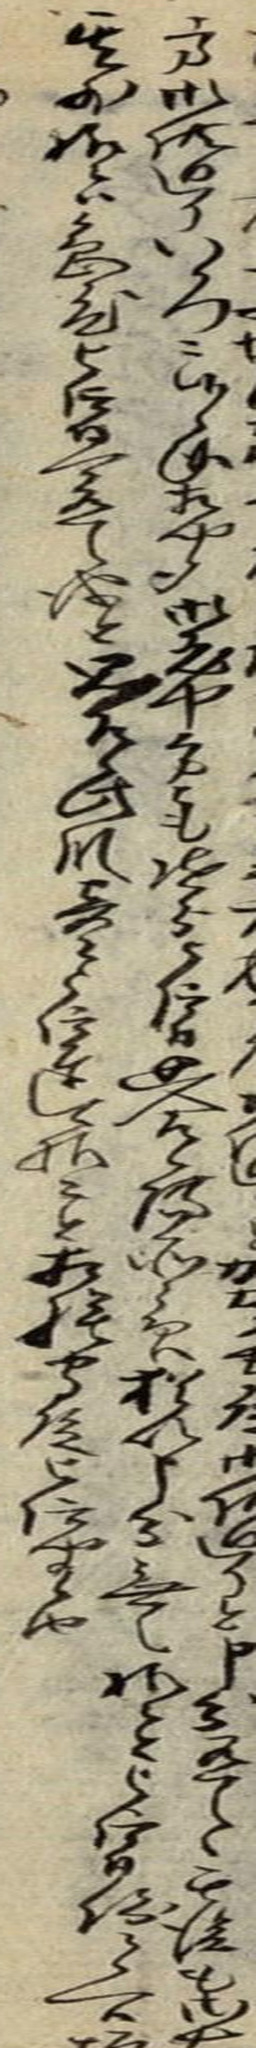其外様には急度被仰付可有之儀と思召候此段寄々被仰達候様にと相模守殿被仰聞候由
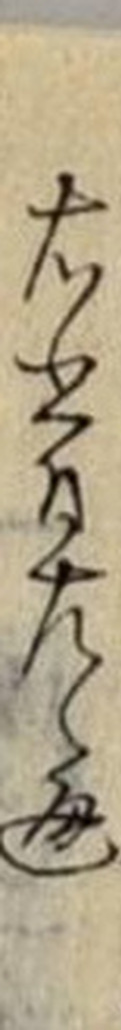右書付左之通
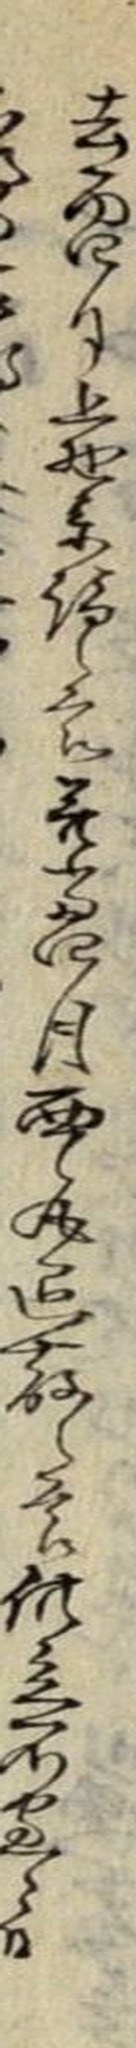去酉四月上野参詣之節并当四月西之丸退散之節供立不慮に付
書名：三都并道中之部
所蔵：福井県文書館 Fukui Prefectural Archives
